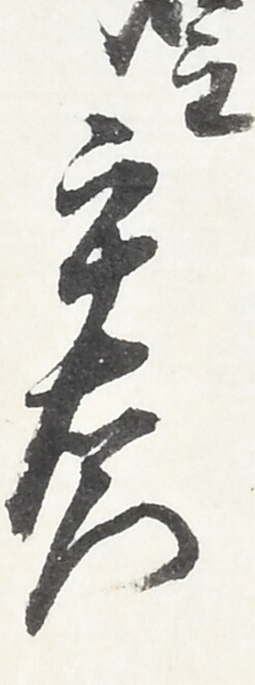理右衛門

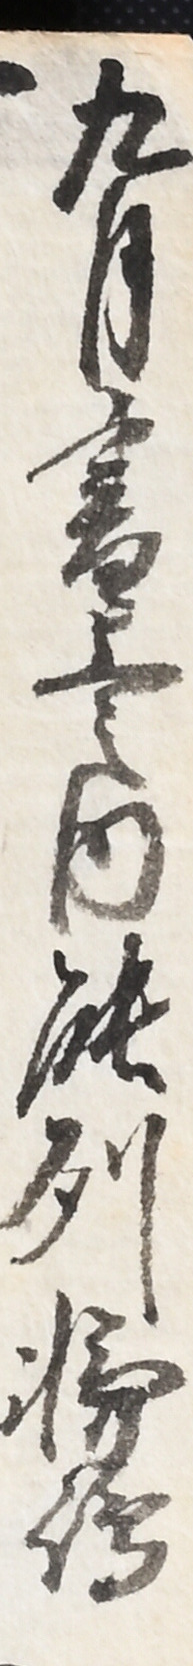九月書上之内能州輪嶋
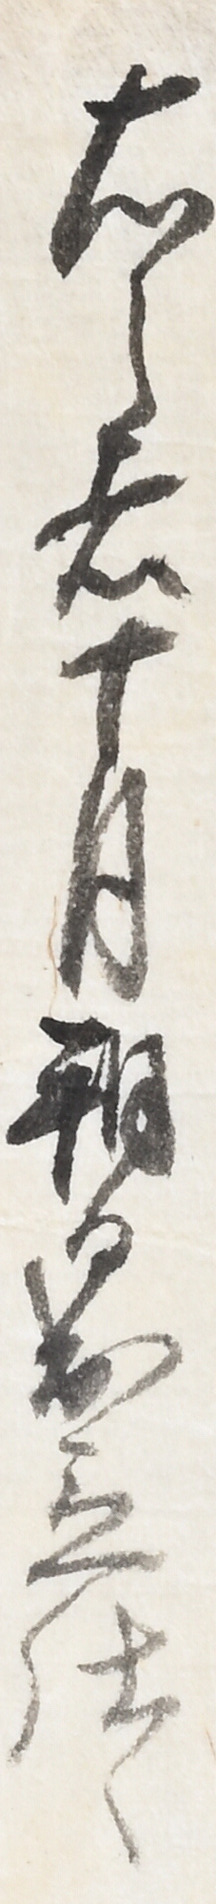右之者十月朔日出立仕候
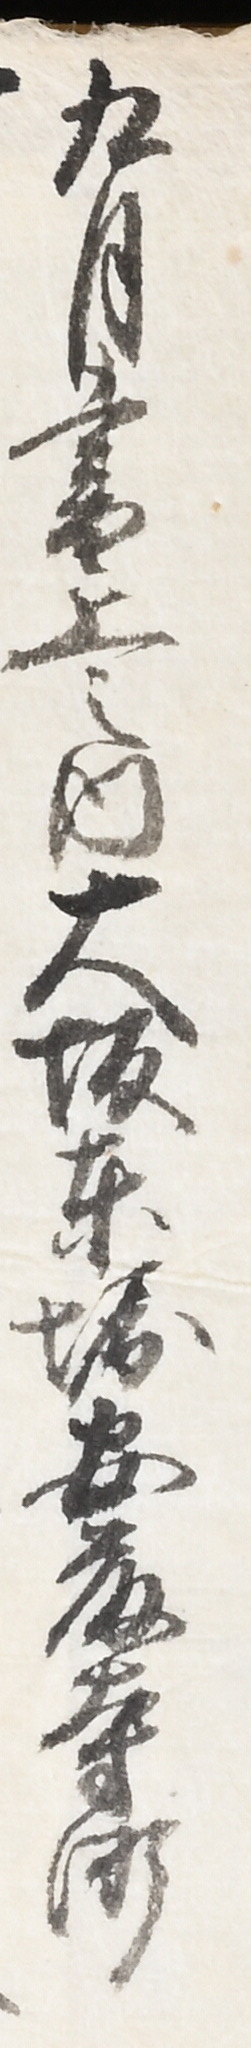九月書上之内大坂東堀安藤寺町
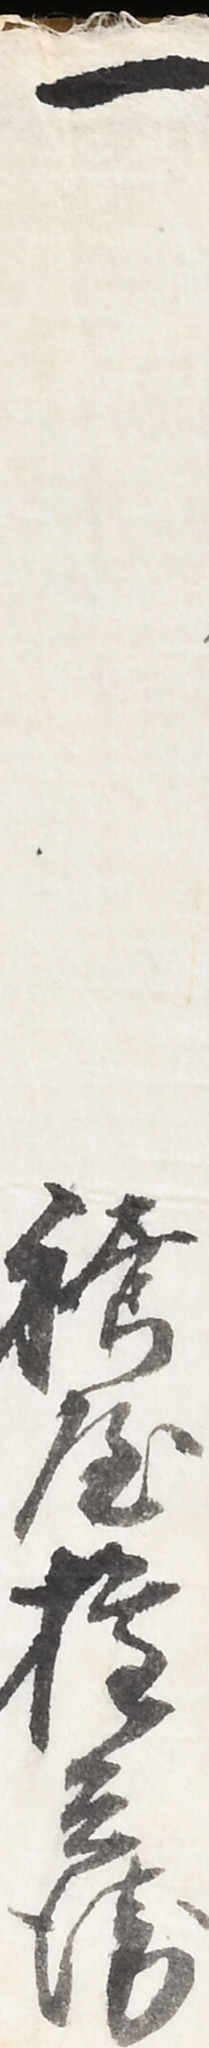一袴屋権兵衛
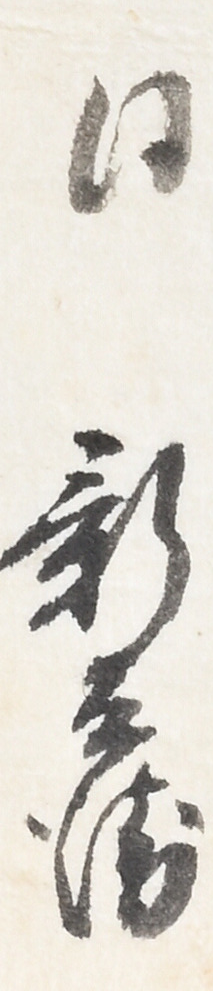同新兵衛
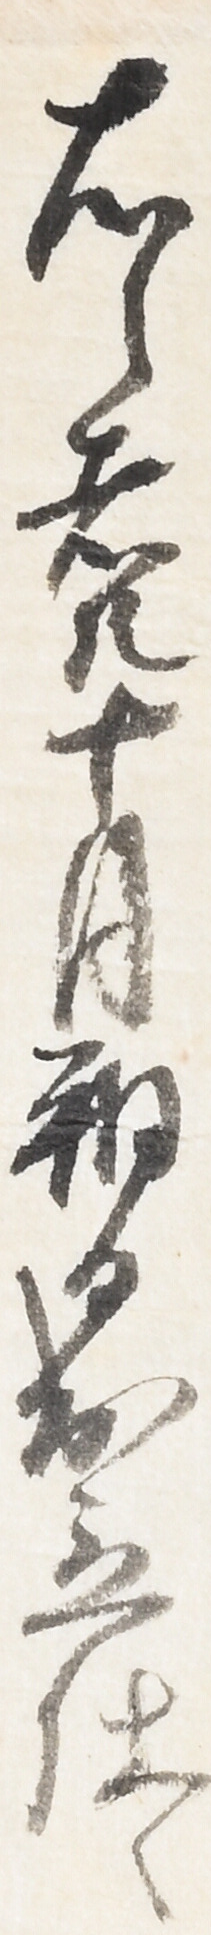右之者共十月朔日出立仕候
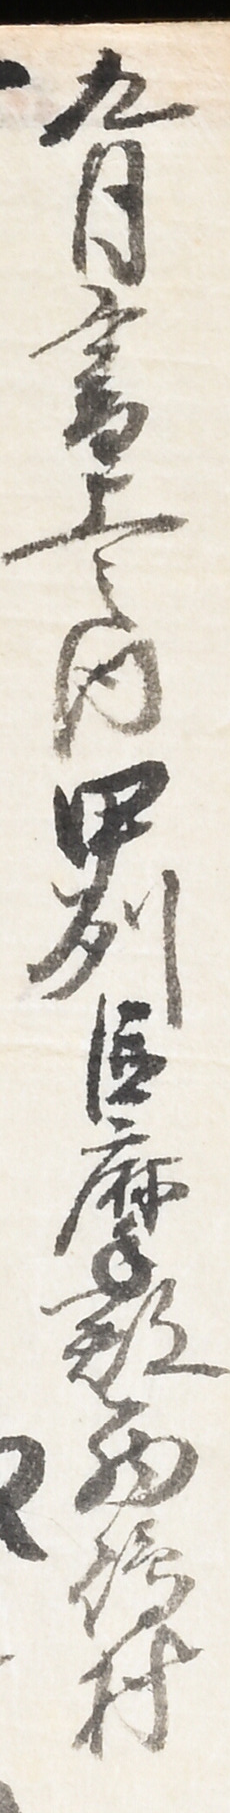九月書上之内甲州巨摩郡西嶋村
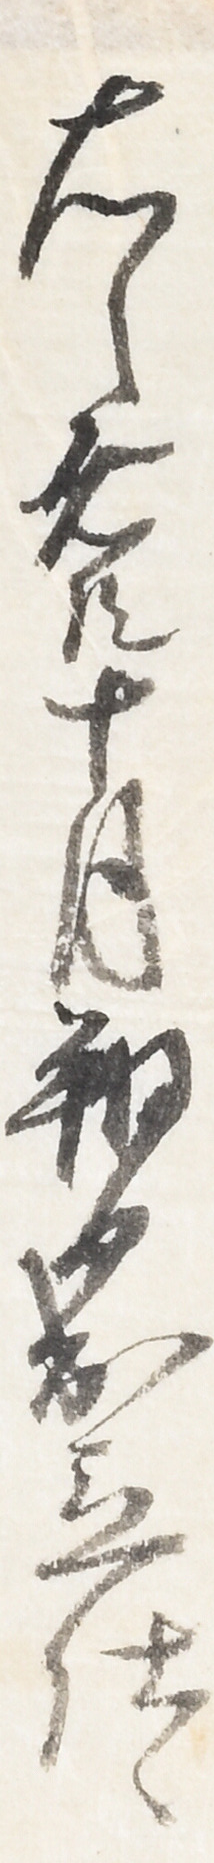右之者共十月朔日出立仕候
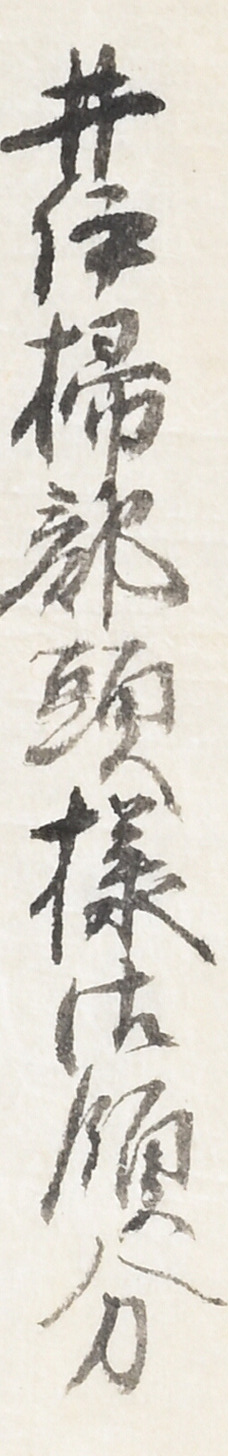井伊掃部頭様御領分
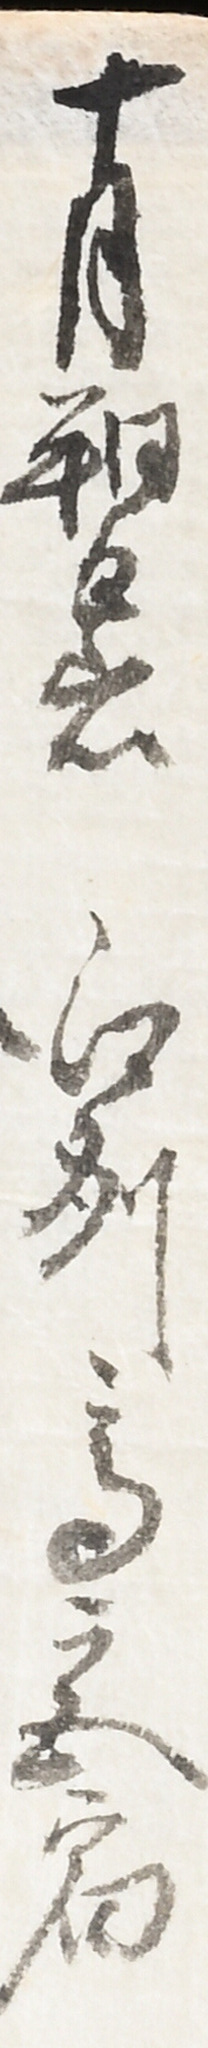十月朔日着江州高宮宿
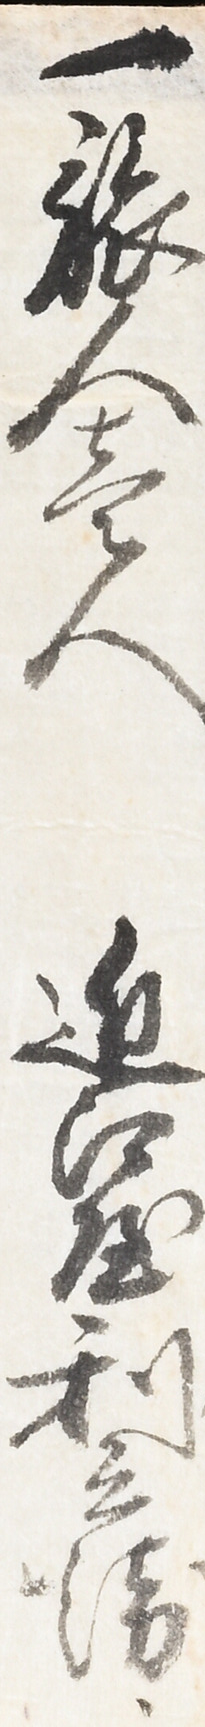一旅人壱人近江屋利兵衛・
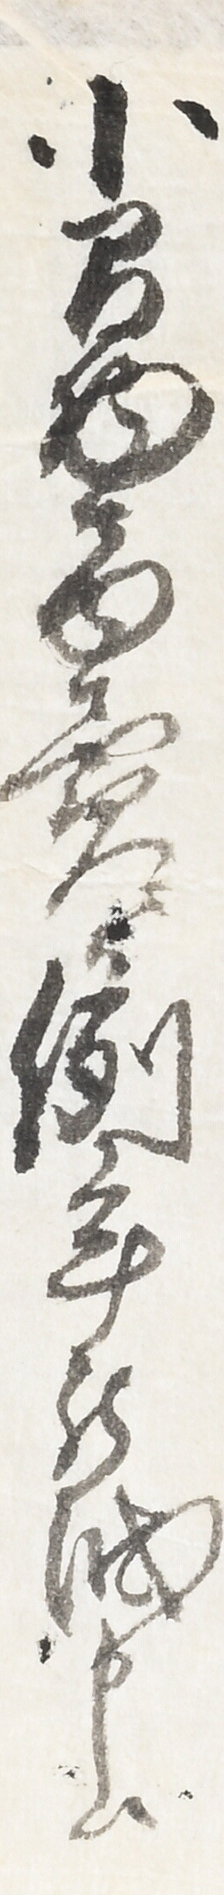小間物商売ニ而例年罷越申候
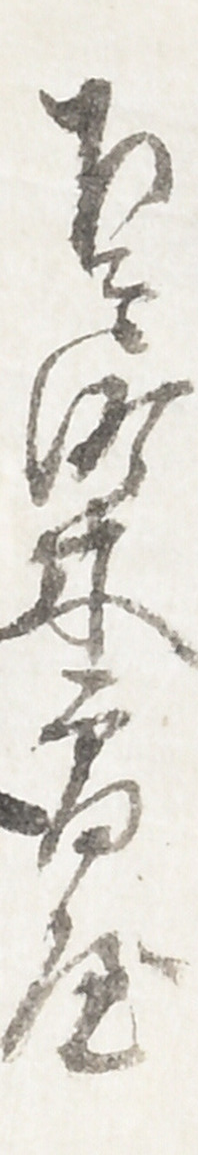下モ町木曽屋
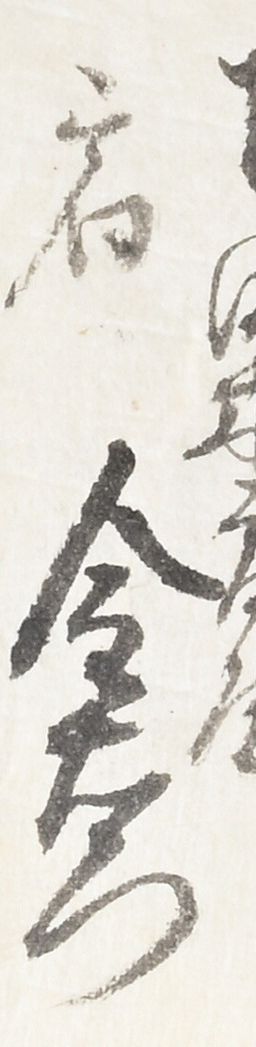宿金右衛門
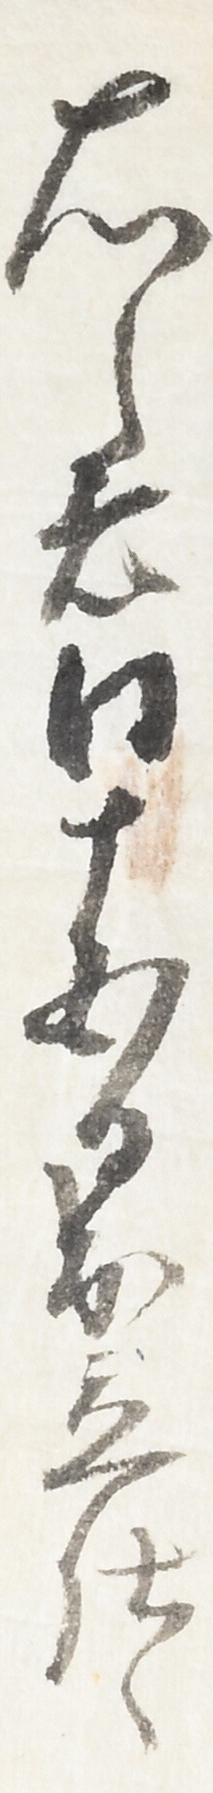右之者同十五日出立仕候
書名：旅人泊控帳
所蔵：伊那市立高遠町図書館・合同会社AMANE
